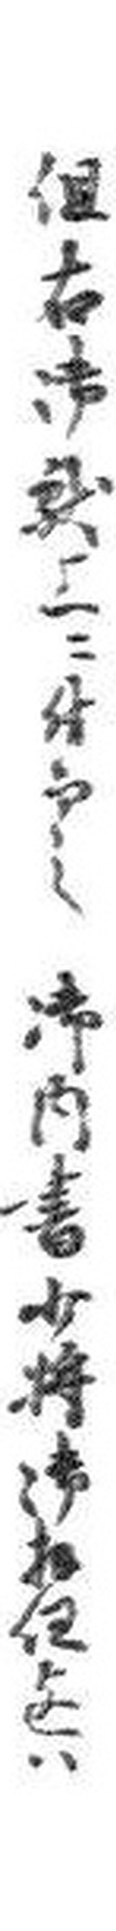但右御献上ニ付而之御内書少将御拝任迄ハ

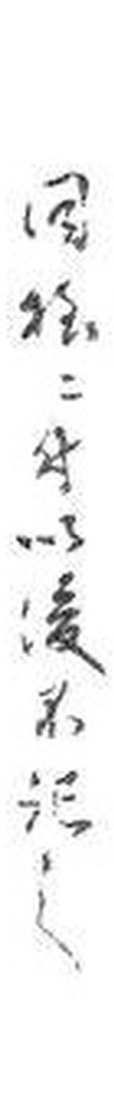同様ニ付以後不記之
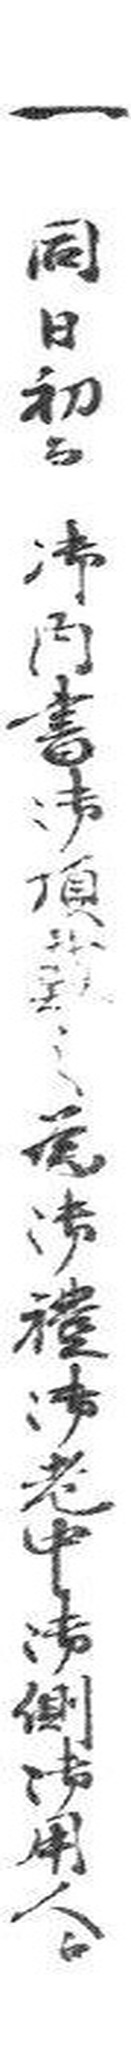一同日初而御内書御頂戴之為御礼御老中御側御用人江
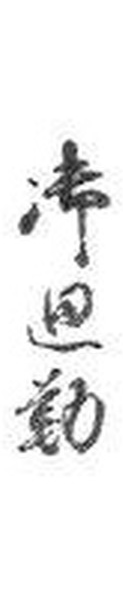御廻勤
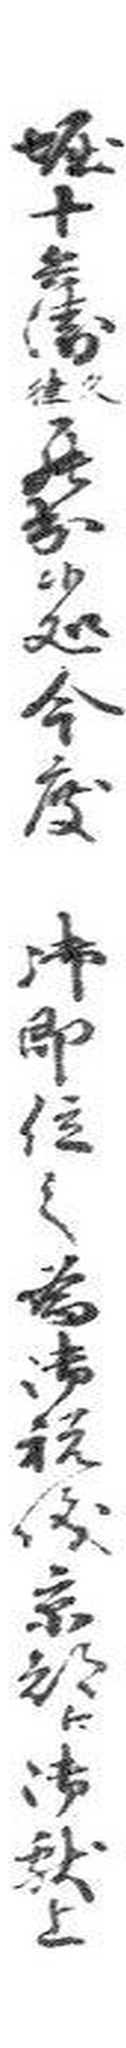堀十兵衛久律罷出候処今度御即位之為御祝儀京都江献上
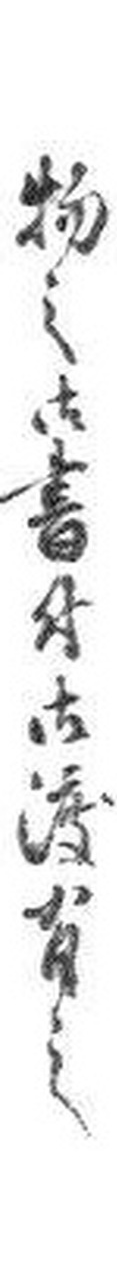物之御書付御渡有之
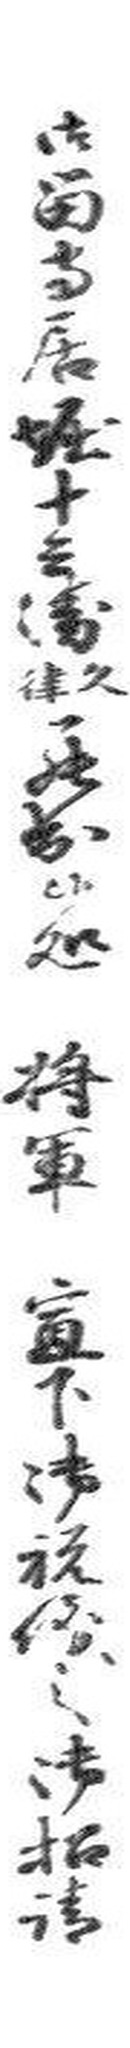御留守居堀十兵衛久律罷出候処将軍宣下御祝儀之御招請
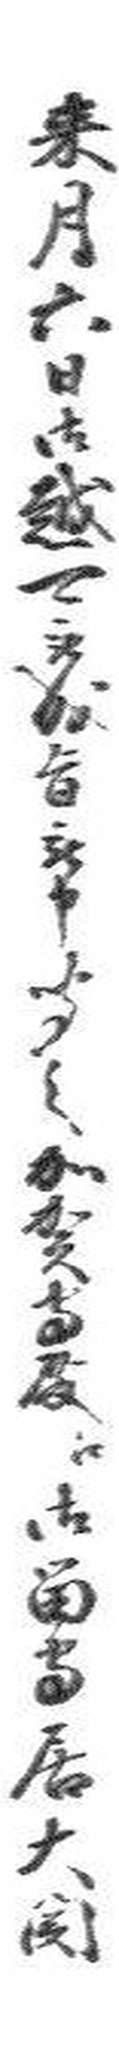来月六日御越可被成旨被申聞之加賀守殿江御留守居大関
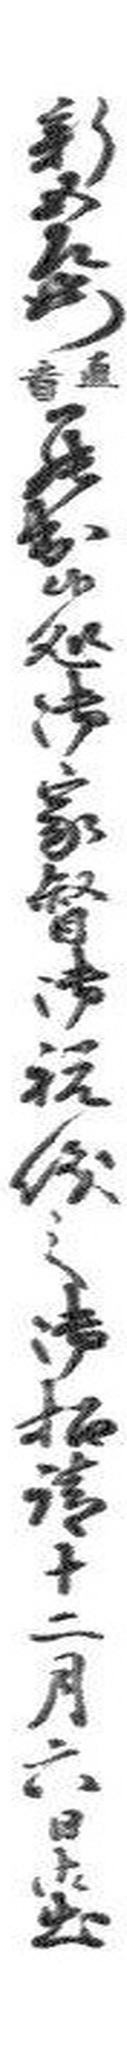新左衛門直看罷出候処御家督御祝儀之御招請十二月六日御出
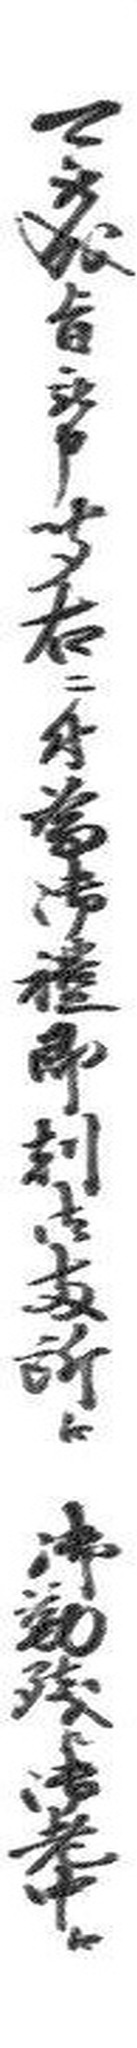可被成旨被申聞右ニ付御礼即刻御両所江御勤残ル御老中江
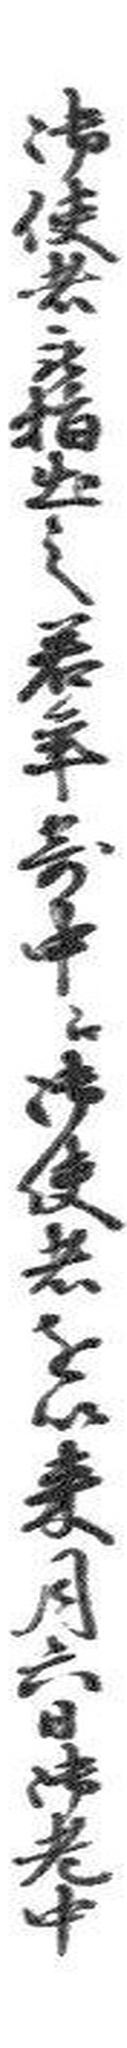御使者被指出之若年寄中江御使者を以来月六日御老中
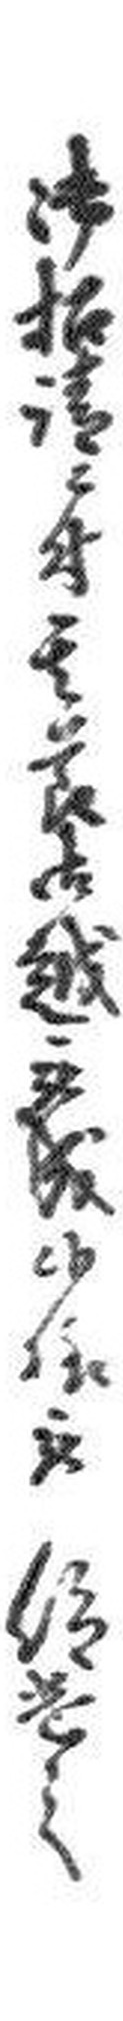御招請ニ付其節御越被成候様被仰遣之
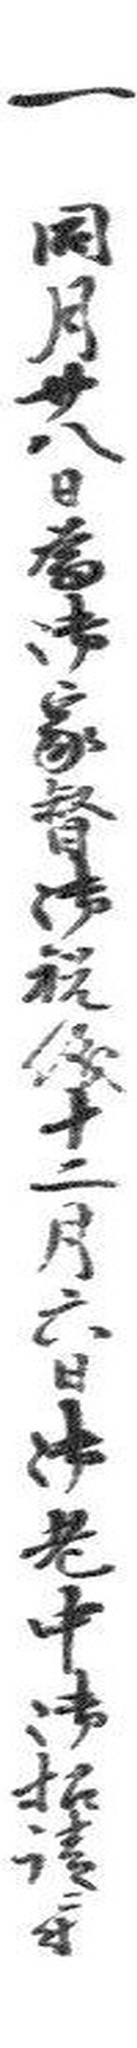一同月廿八日為御家督御祝儀十二月六日御老中御招請ニ付
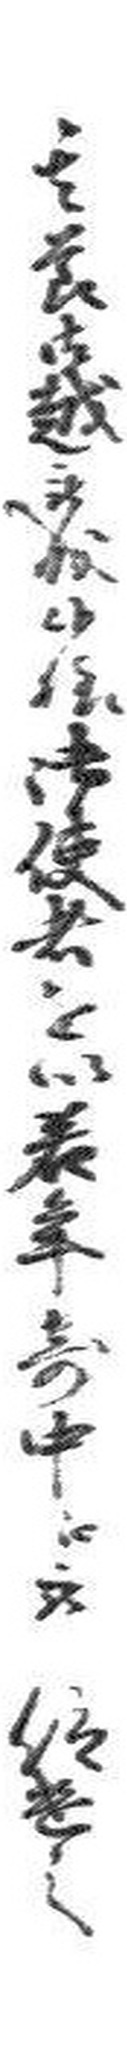其節御越被成候様御使者を以若年寄中江仰遣之
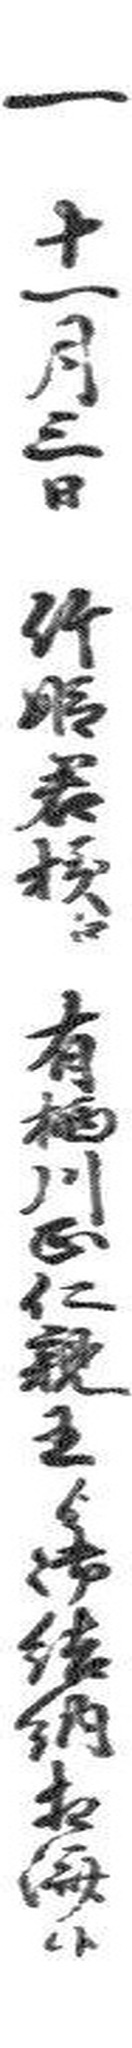一十一月三日竹姫君様江有栖川正仁親王ゟ御結納相済候
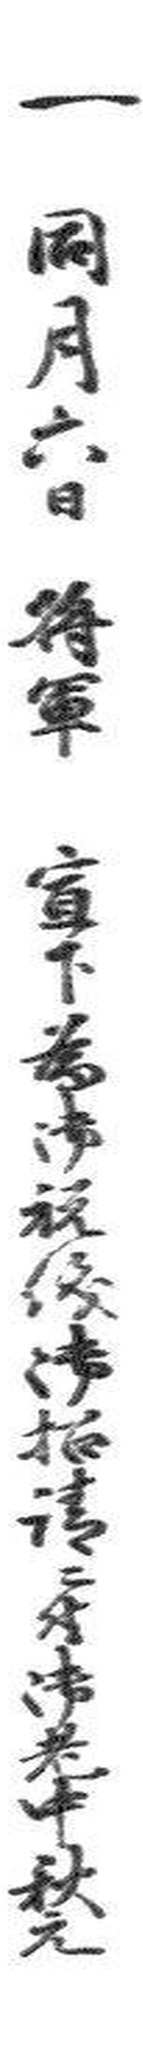一同月六日将軍宣下為御祝儀御招請ニ付御老中秋元
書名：家譜 二十八 吉邦公 従宝永七年七月五日到正徳元年十二月
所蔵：福井県文書館 Fukui Prefectural Archives
